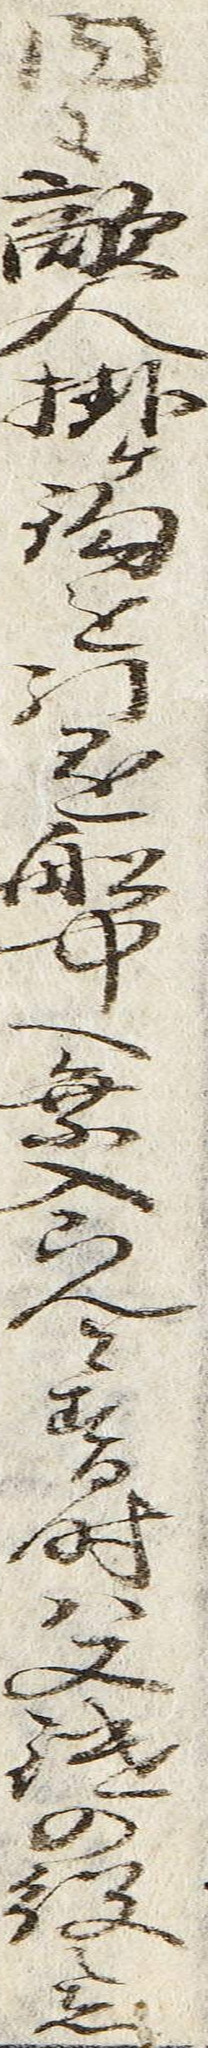内に敵人掛け鈎を引懸船中へ乗入らんとする時は又鑓の役の者
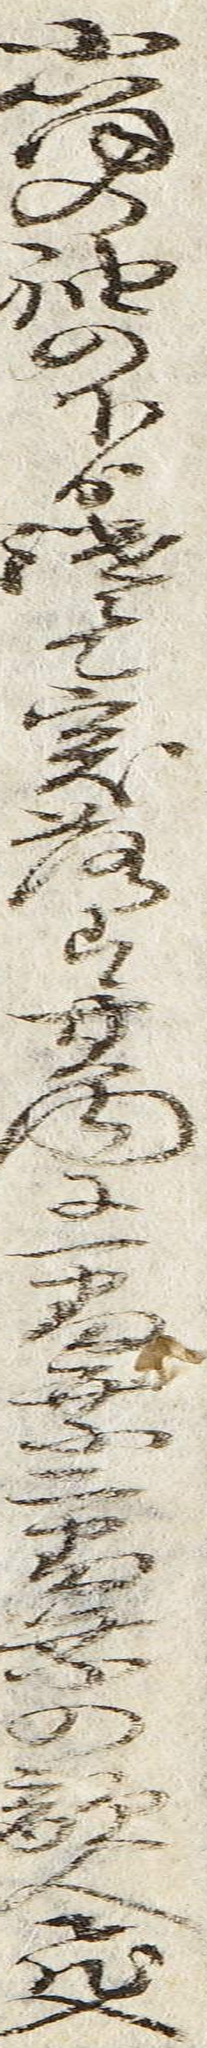小筒の袖の下ゟ鑓にて突落す其内に一番乗二番乗の敵人飛入
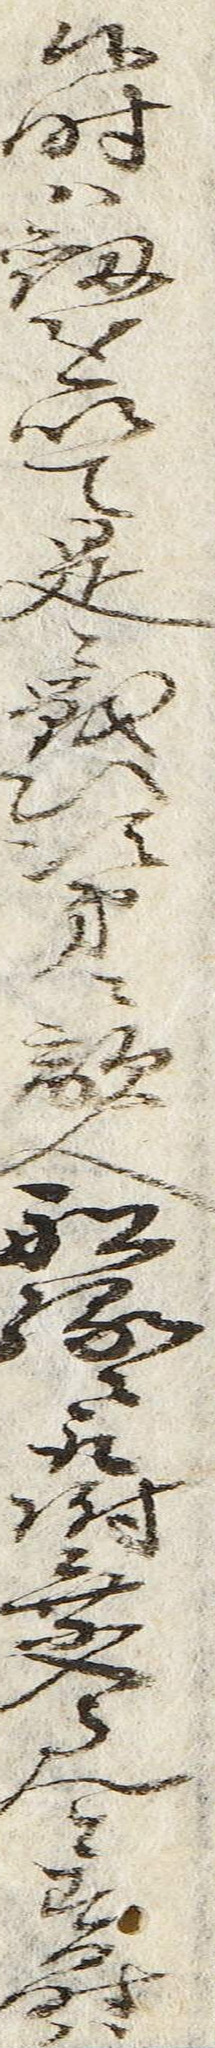候時は剱を以て是と戦ひ次第に敵人船縁に取附乗入らんとする時は
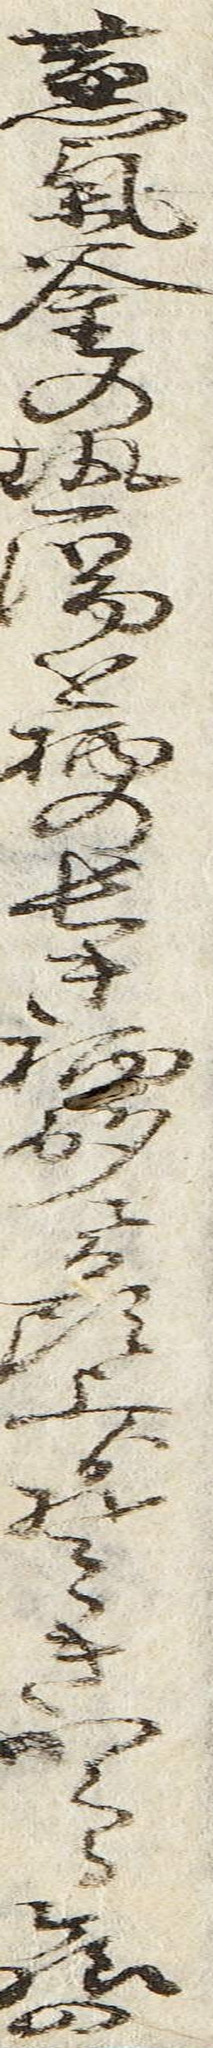蒸気釜の熱湯を柄の長き柄酌にて頭上ゟそゝきかくるケ様の
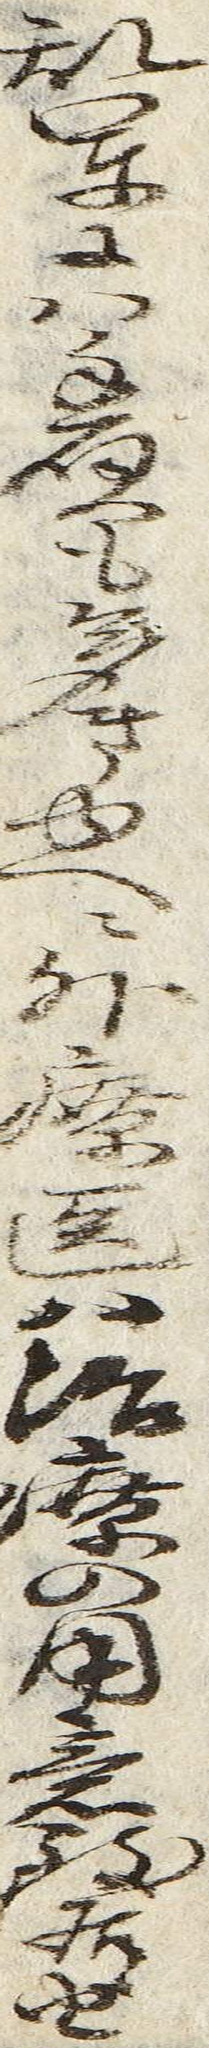乱軍には手負も多きゆへに外療医は治療の用意致居由
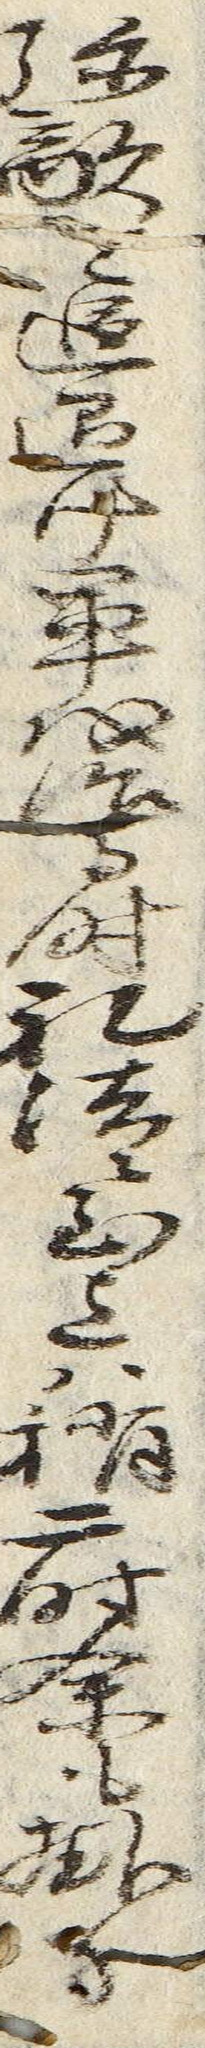弥敵を追退け軍を治る時礼法に至迄は稍二時余も掛り
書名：漂流夢物語
